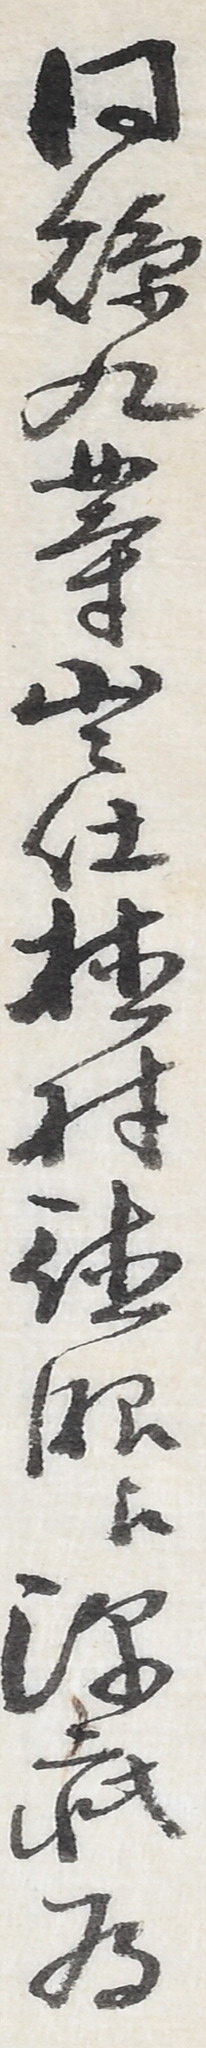同県九等出仕植村徳昭え深疵為
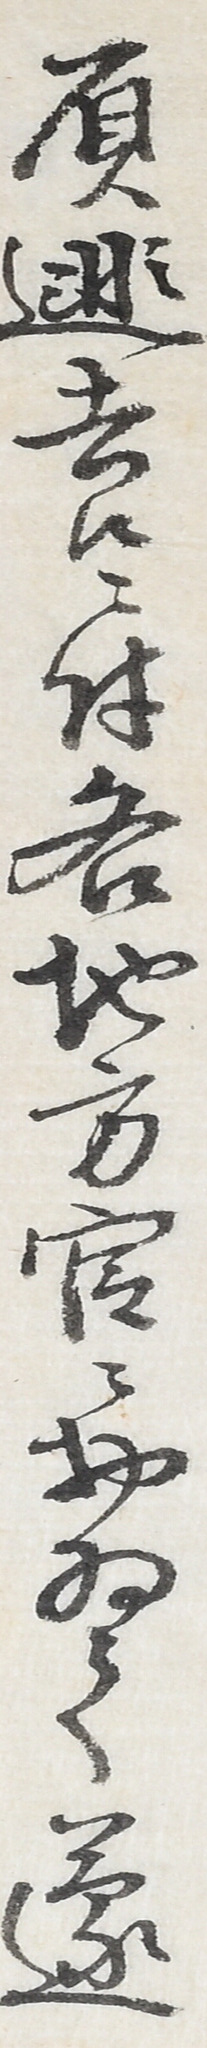負逃去候ニ付各地方官におゐて遂
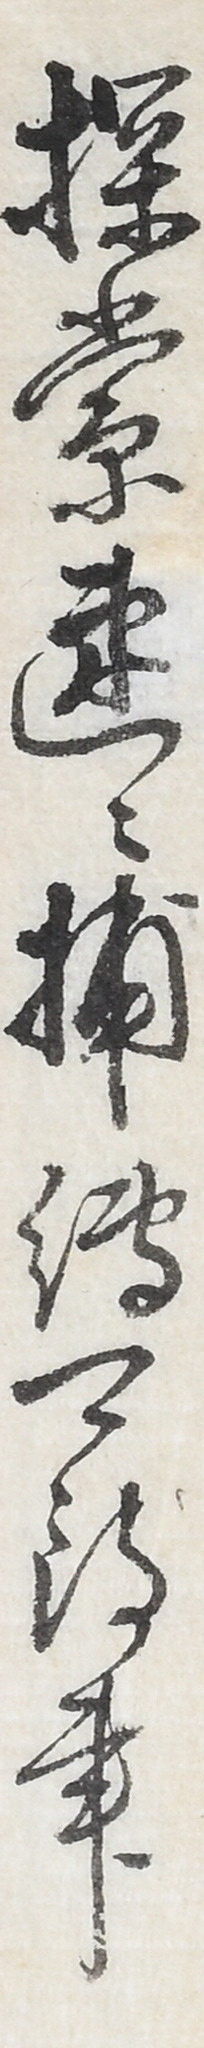探索速に捕縛可致事
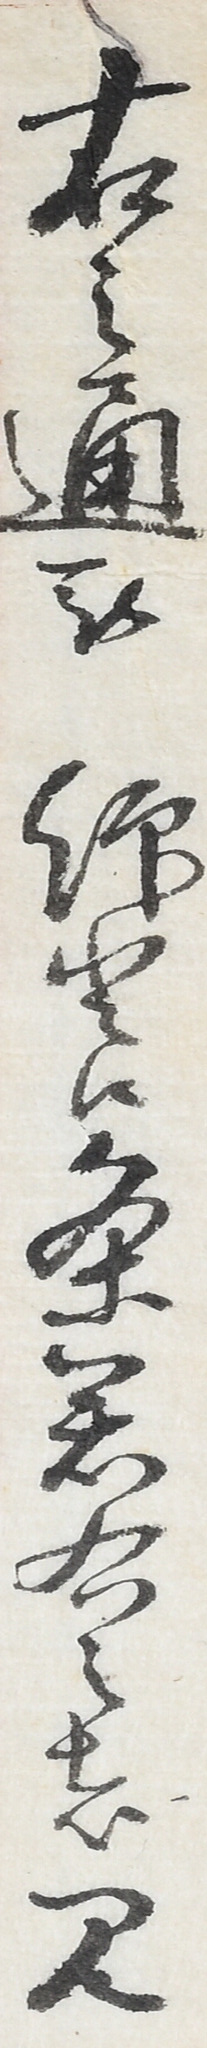右之通被仰出候条若右之者見
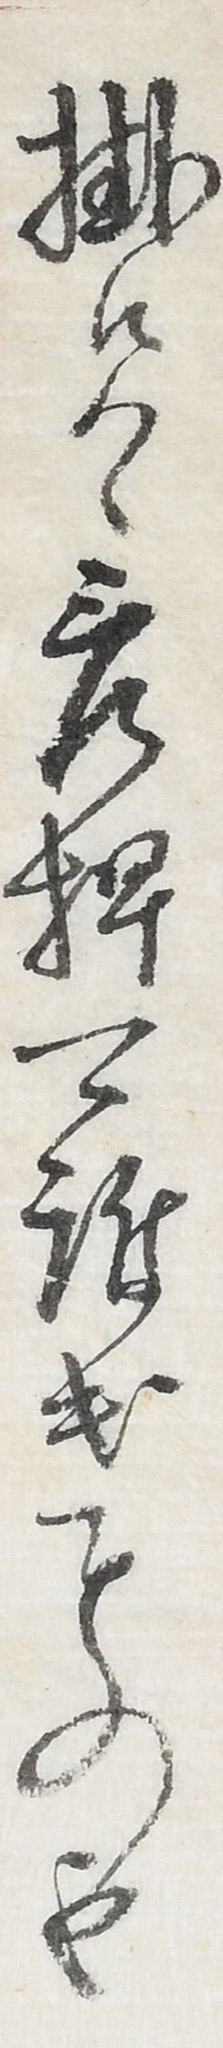掛候ハゝ差押可訴出もの也
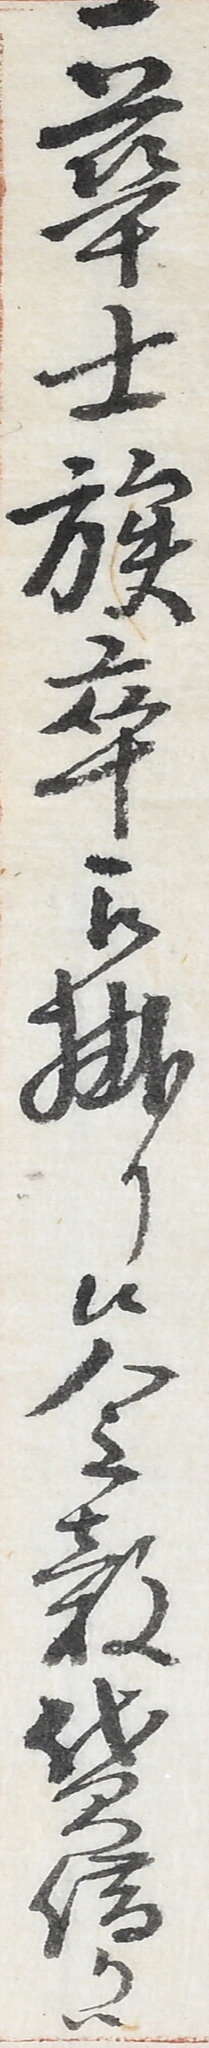一華士族卒取掛り候金穀貸借りは

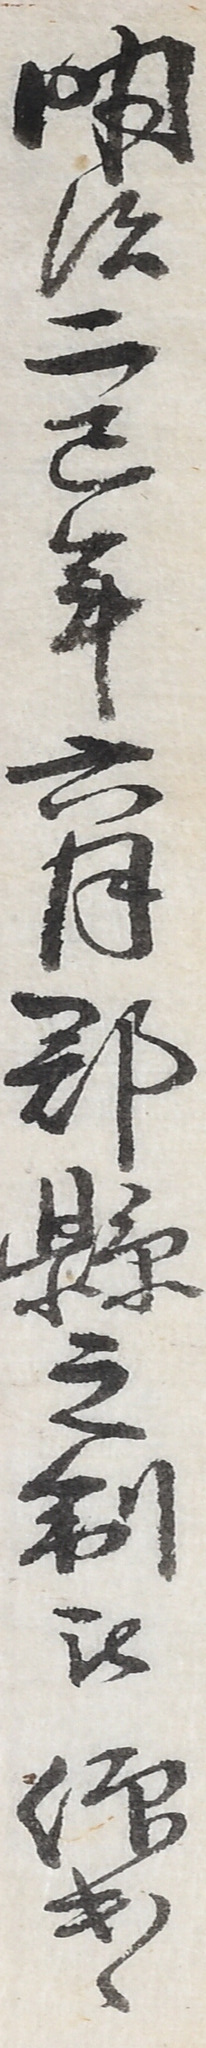明治二巳年六月郡県の制被仰出候
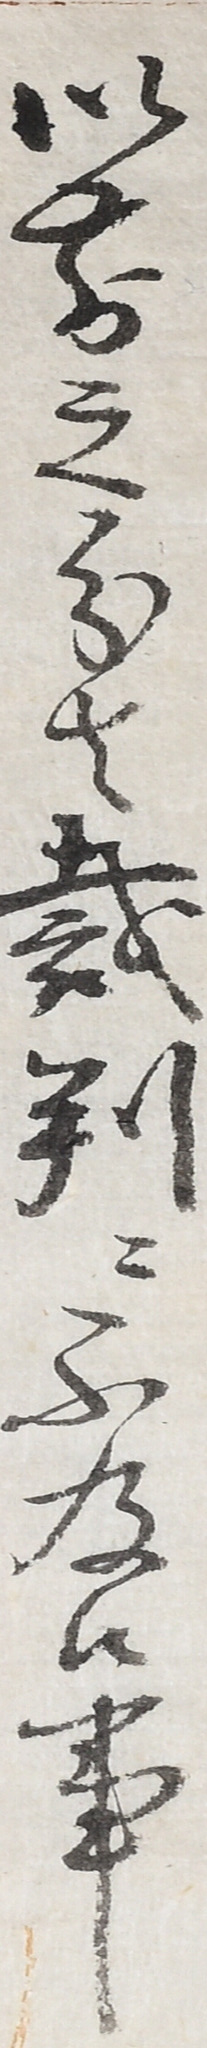以前之分は裁判ニ不及候事
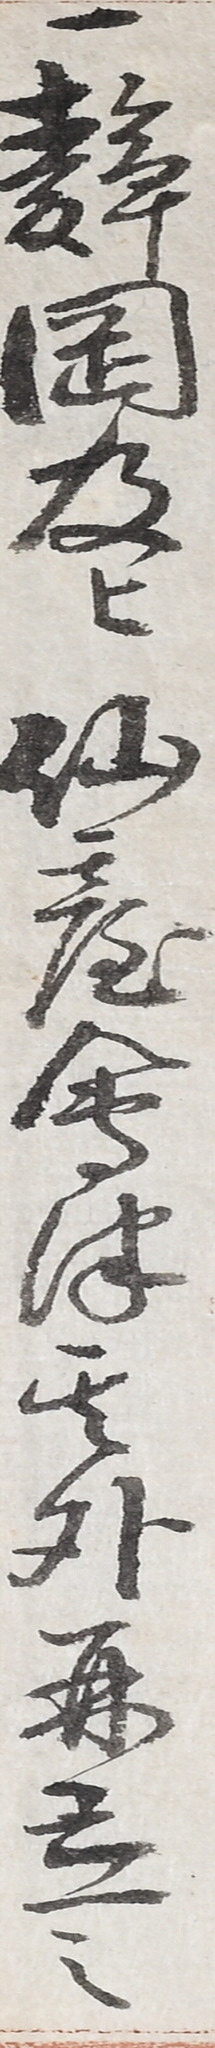一静岡及ヒ仙台会津其外再立之
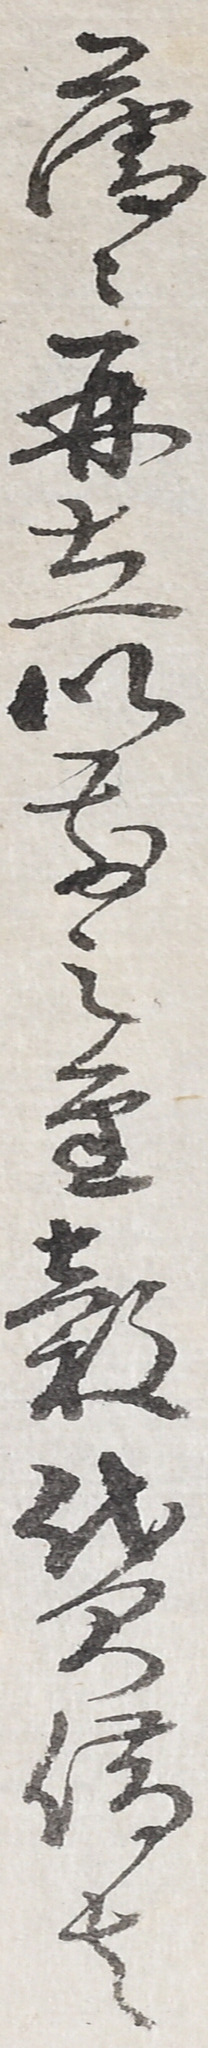藩々再立以前之金穀貸借は
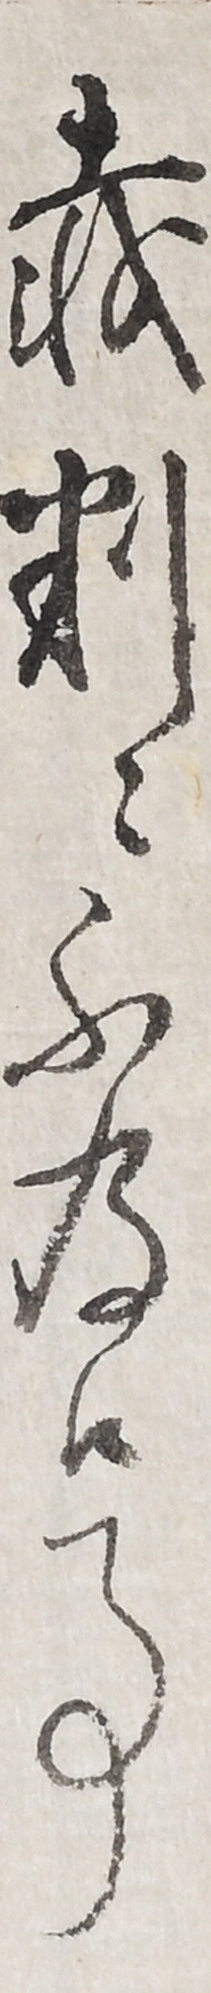裁判ニ不及候事
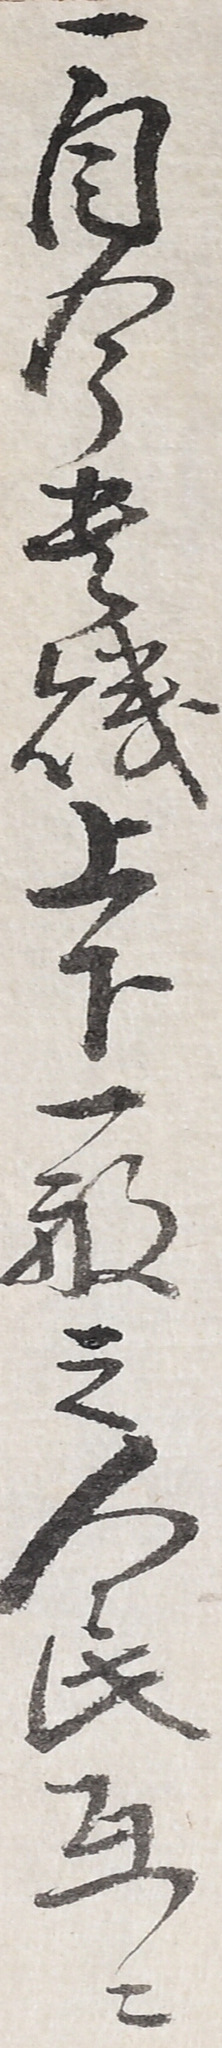一自今貴賤上下一般之人民互ニ
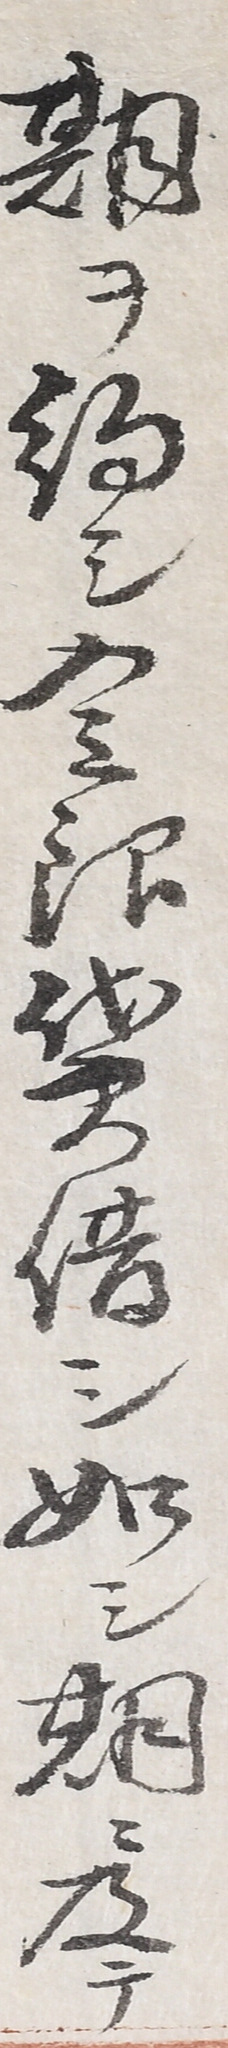期ヲ約シ金銀貸借シ如シ期ニ及テ
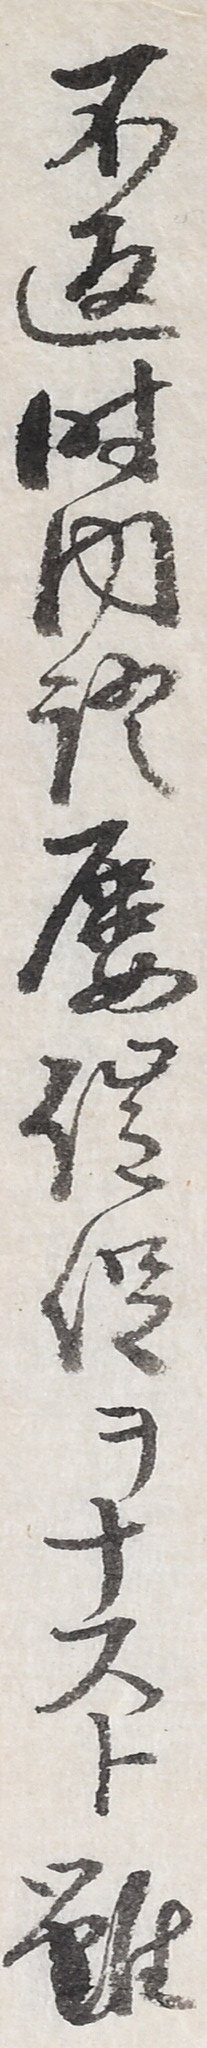不返時内談屢催促ヲナスト雖
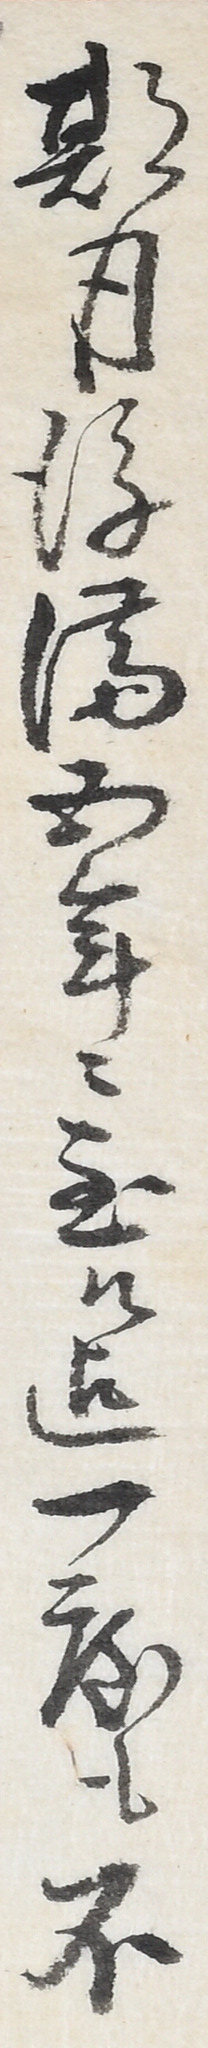期月後満五年ニ至ル迄一度も不
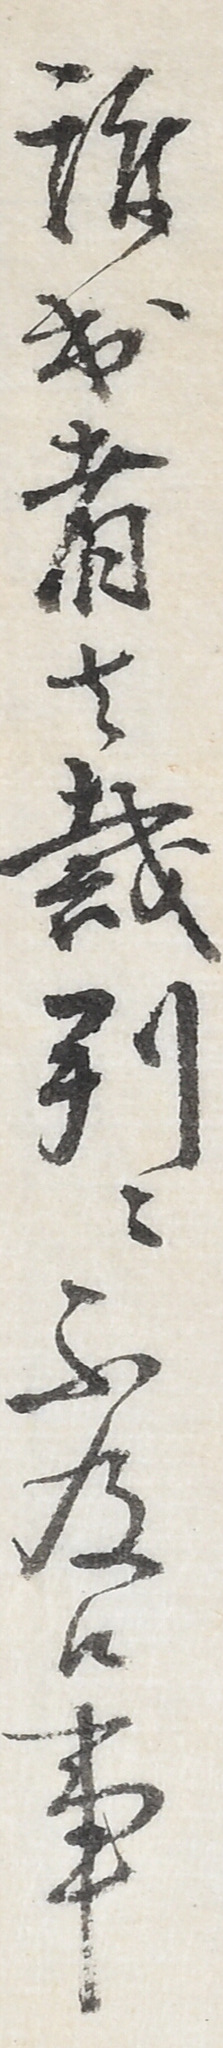訴出者は裁判ニ不及候事
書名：壹番・御布告一式
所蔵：伊那市立高遠町図書館・合同会社AMANE
